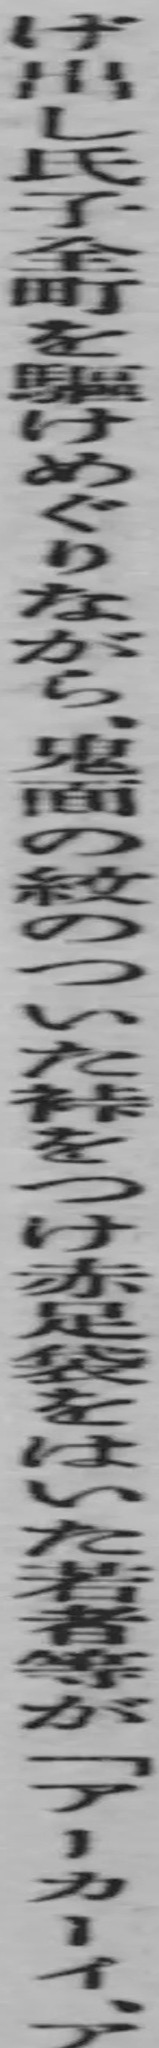げ出し氏子全町を驅けめぐりながら、鬼面の紋のついた裃をつけ赤足袋をはいた若者等が「アーカーイ、ア
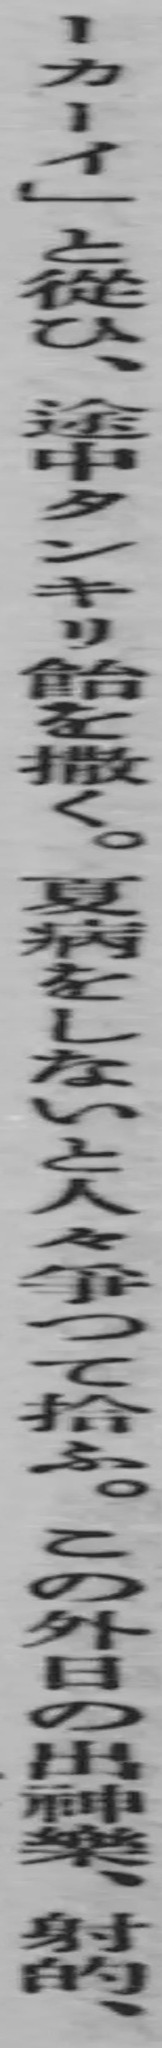ーカーイ」と從ひ、途中タンキリ飴を撒く。夏病をしないと人々爭つて拾ふ。この外日の出神樂、射的、
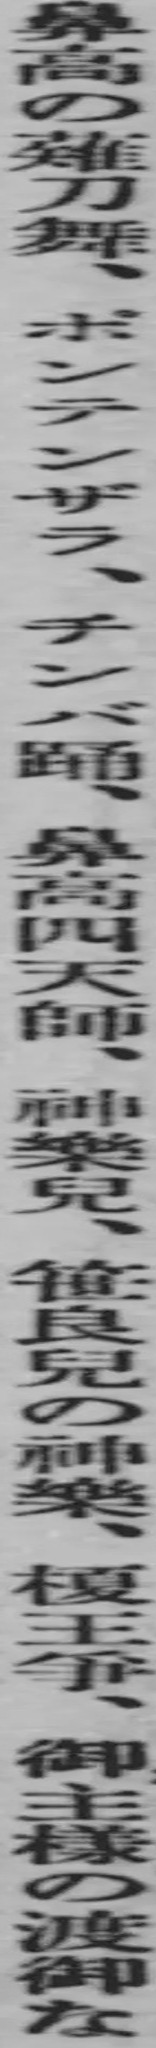鼻高の薙刀舞、ポンテンザラ、チンバ踊、鼻高四天師、神樂兒、笹良兒の神樂、榎王爭、御主様の渡御な
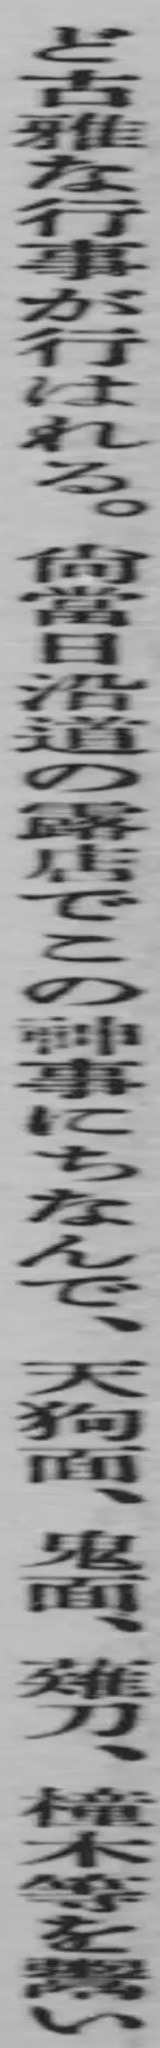ど古雅な行事が行はれる。尚當日沿道の露店でこの神事にちなんで、天狗面、鬼面、薙刀、橦木等を鬻い
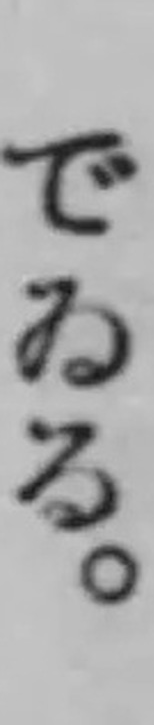でゐる。
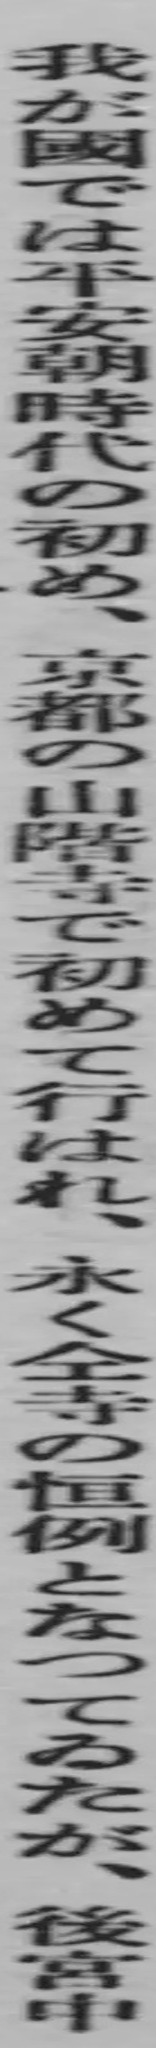我が國では平安朝時代の初め、京都の山階寺で初めて行はれ、永く仝寺の恒例となつてゐたが、後宮中
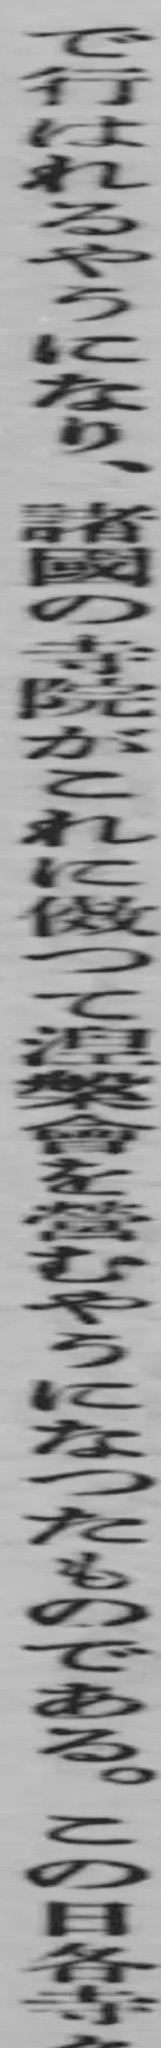で行はれるやうになり、諸國の寺院がこれに傚つて涅槃會を營むやうになつたものである。この日各寺々
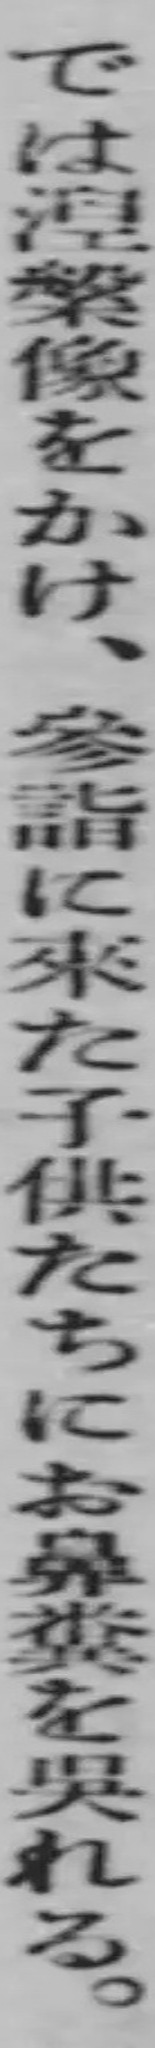では涅槃像をかけ、參詣に來た子供たちにお鼻糞を吳れる。

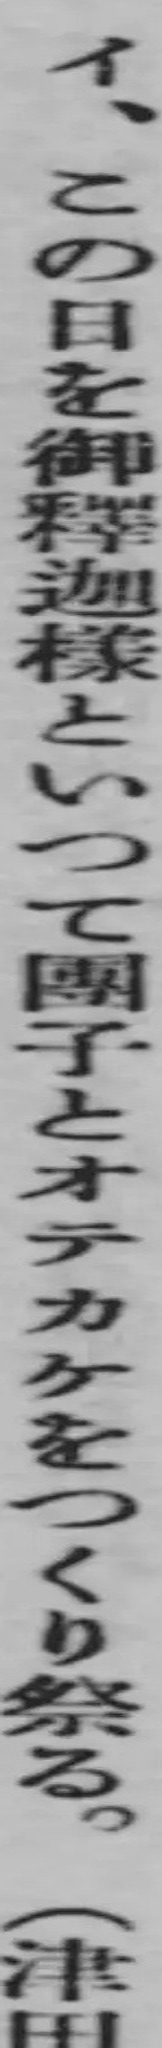イ、この日を御釋迦様といつて團子とオテカケをつくり祭る。(津田)
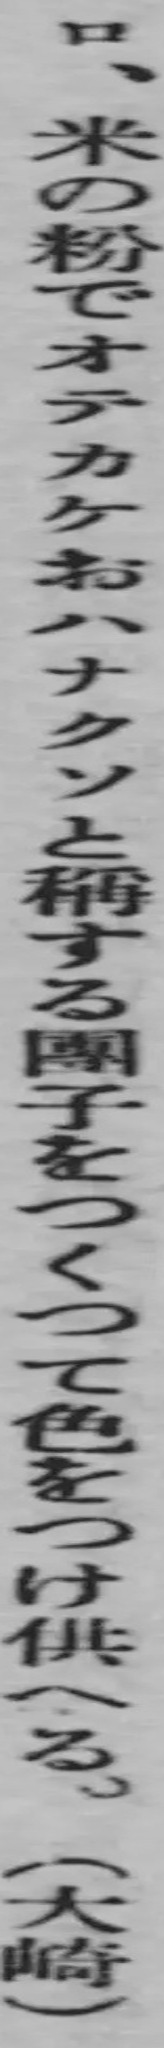ロ、米の粉でオテカケおハナクソと稱する團子をつくつて色をつけ供へる。(大崎)
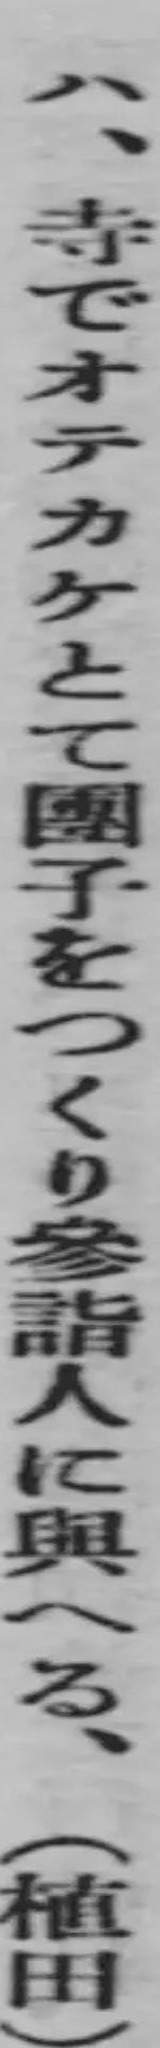ハ、寺でオテカケとて團子をつくり參詣人に與へる。(植田)
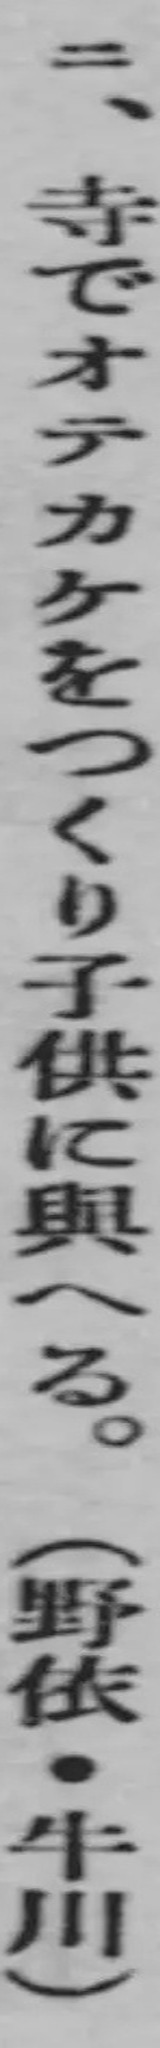ニ、寺でオテカケをつくり子供に與へる。(野依・牛川)
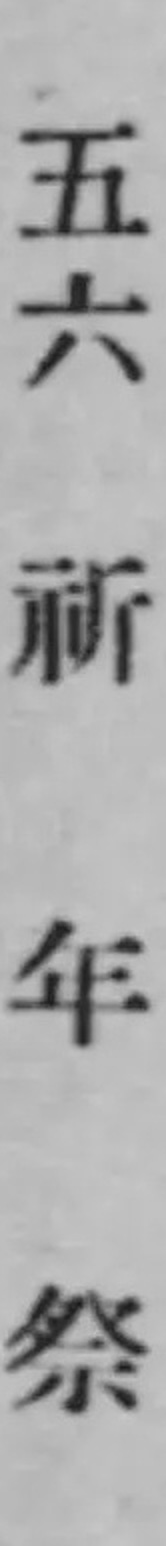五六祈年祭
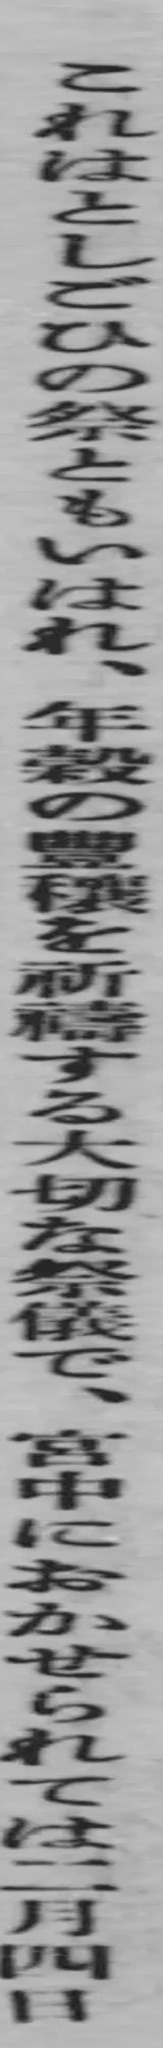これはとしごひの祭ともいはれ、年穀の豐穰を祈禱する大切な祭儀で、宮中におかせられては二月四日
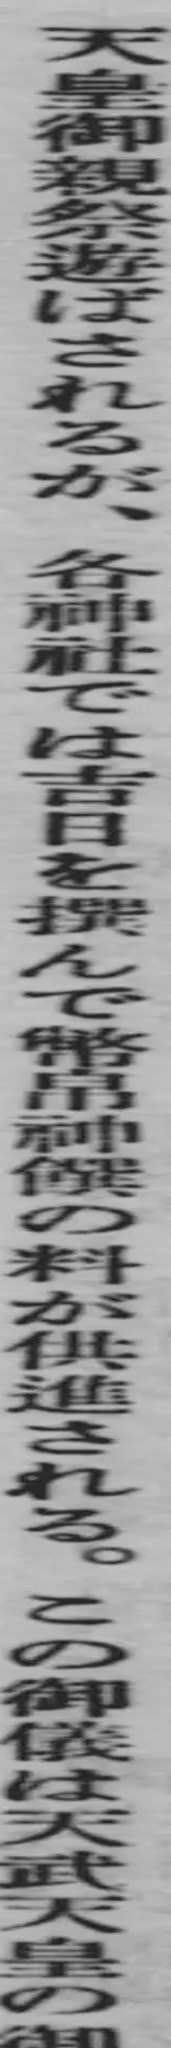天皇御親祭遊ばされるが、各神社では吉日を撰んで幣帛神饌の料が供進される。この御儀は天武天皇の御
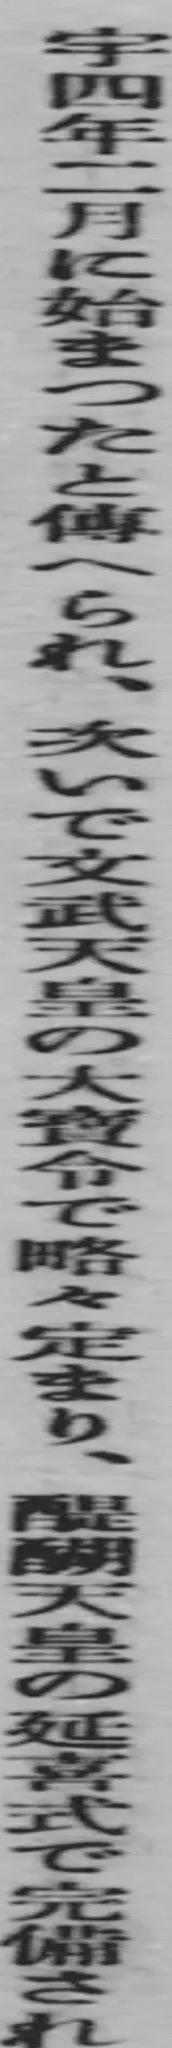宇四年二月に始まつたと傳へられ、次いで文武天皇の大寶令で略々定まり、醍醐天皇の延喜式で完備され
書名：豊橋の年中行事
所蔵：国立国会図書館 National Diet Library, JAPAN
